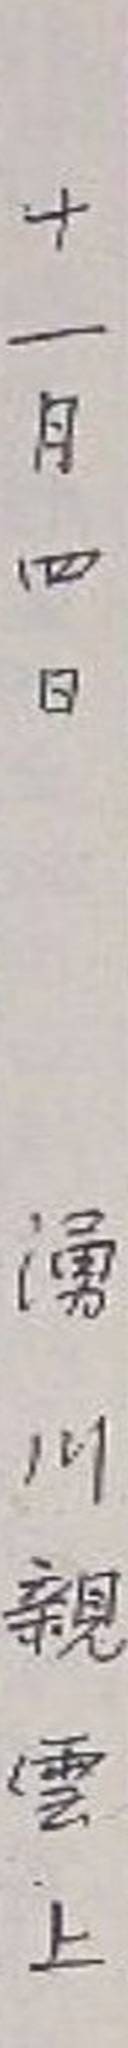十一月四日湧川親雲上
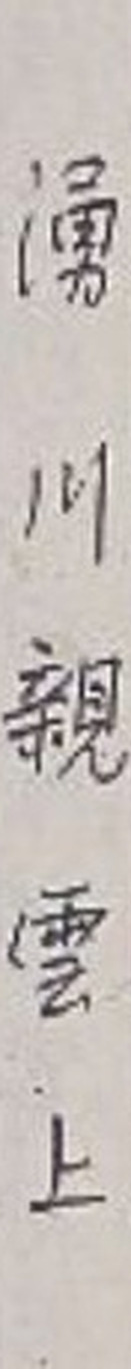湧川親雲上
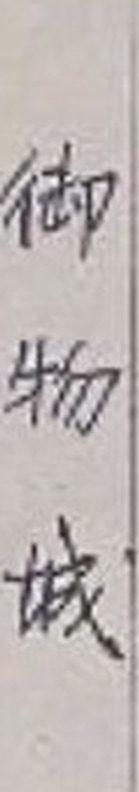御物城
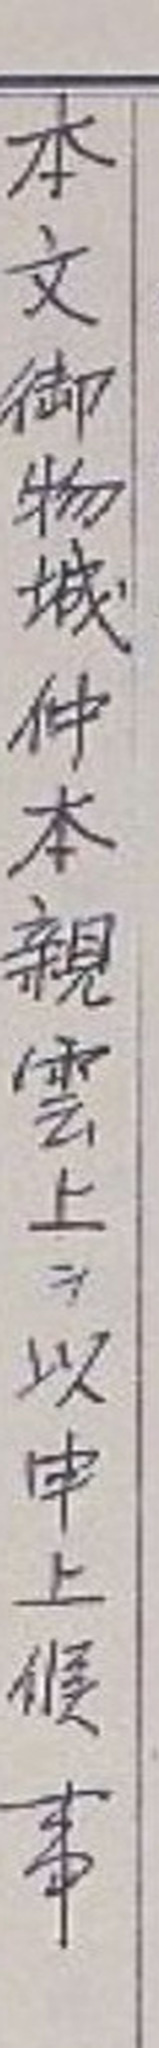本文御物城仲本親雲上を以申上候事
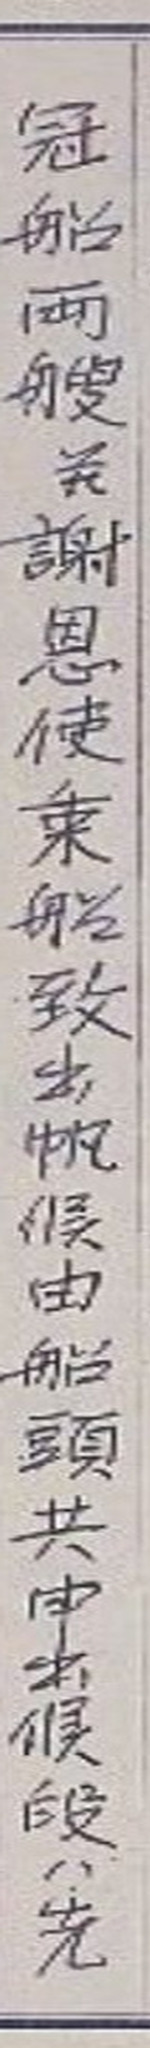冠船両艘并謝恩使乗船致出帆候由船頭共申出候段は先
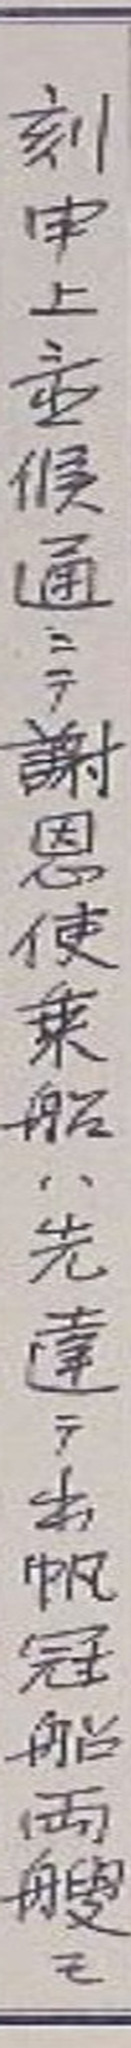刻申上置候通にて謝恩使乗船は先達て出帆冠船両艘も
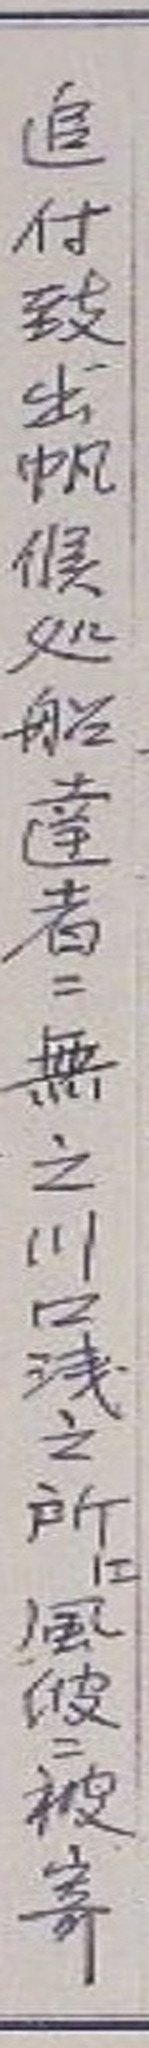追付致出帆候処船達者に無之川口浅之処え風波に被寄

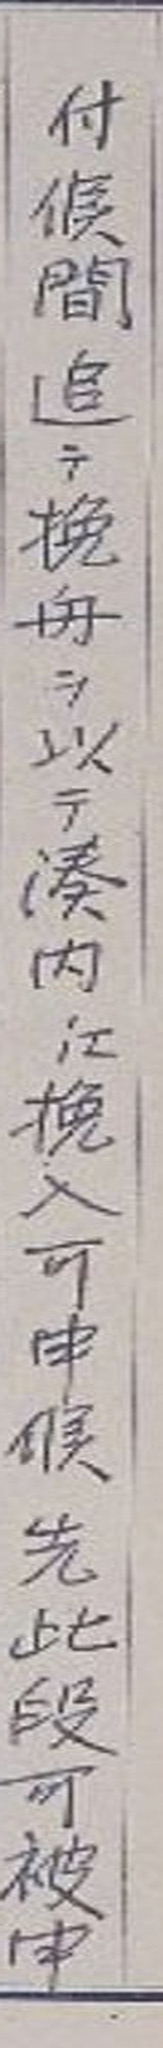付候間追て挽舟を以て湊内え挽入可申候先此段可被申
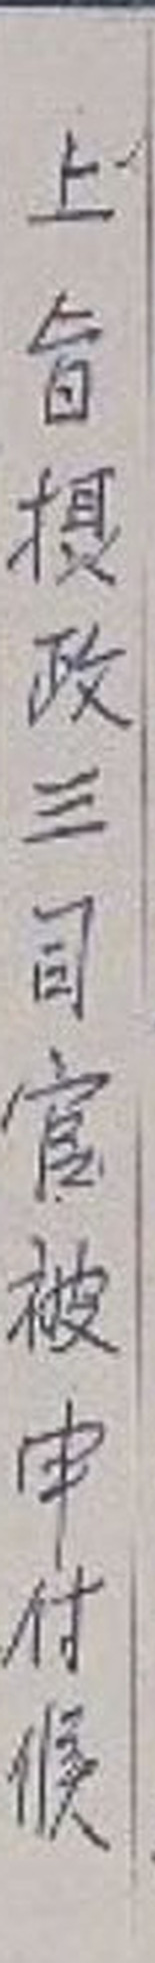上旨摂政三司官被申付候
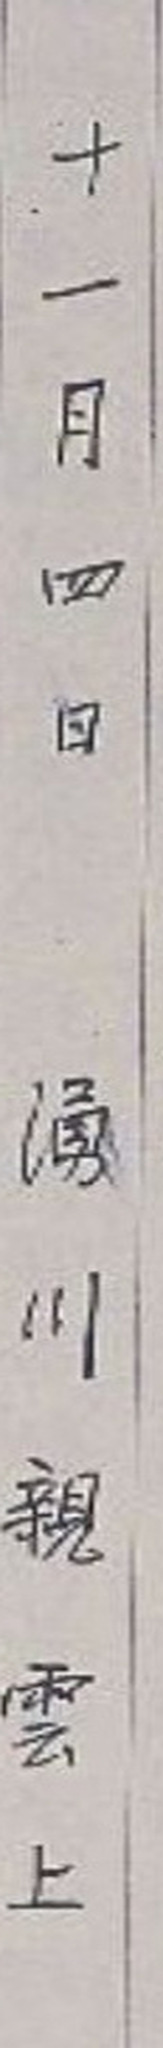十一月四日湧川親雲上
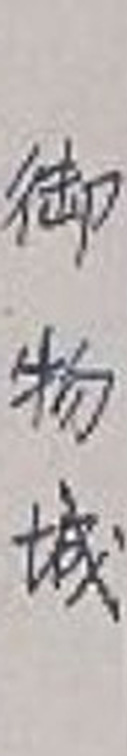御物城
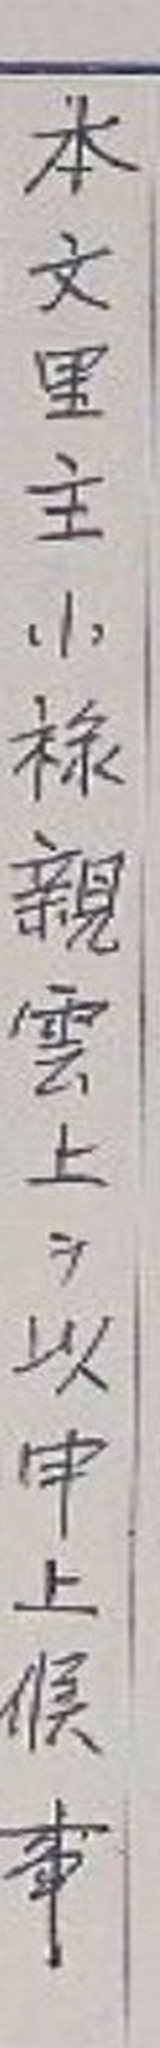本文里主小禄親雲上を以申上候事
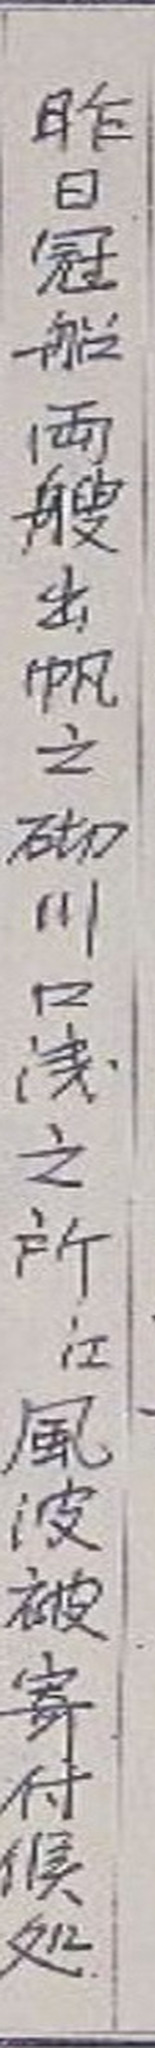昨日冠船両艘出帆之砌川口浅之所え風波被寄付候処
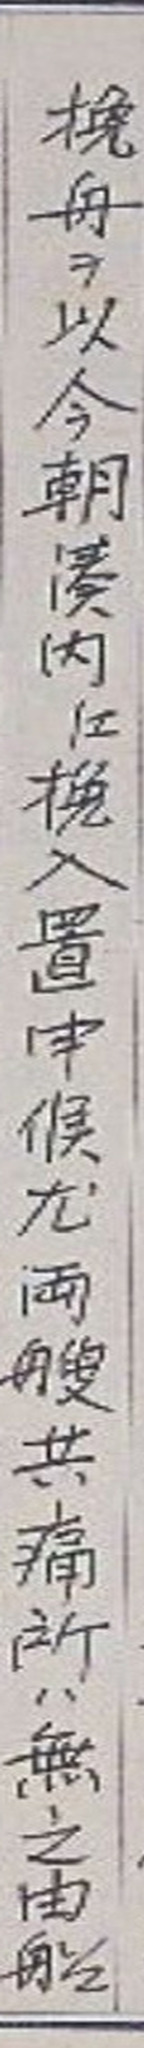挽舟を以今朝湊内え挽入置申候尤両艘共痛所は無之由船
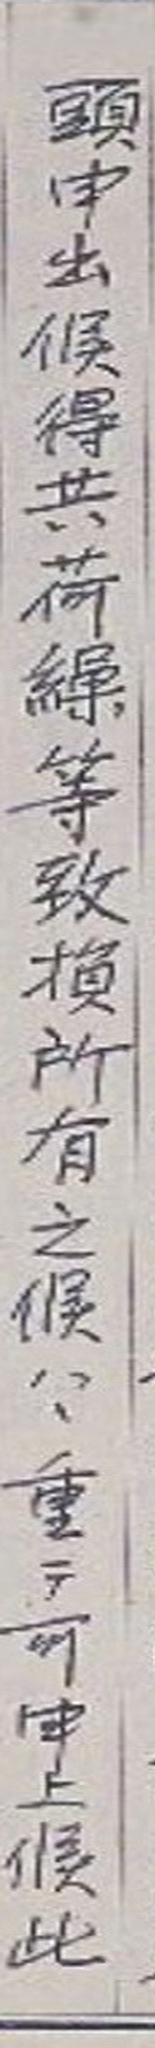頭申出候得共荷繰等致損所有之候はゝ重て可申上候此
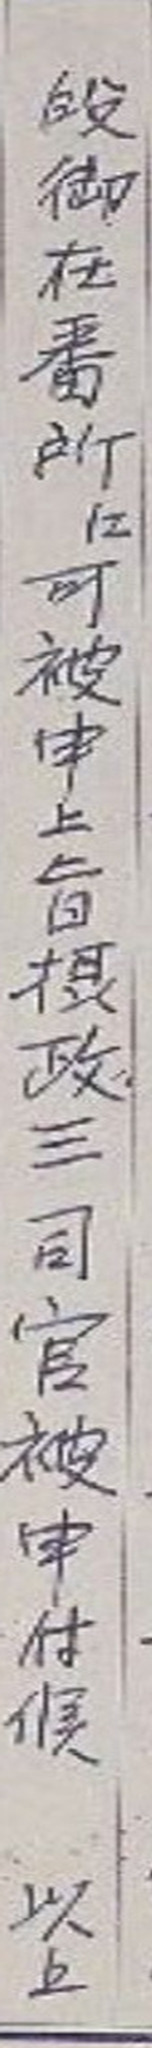段御在番所え可被申上旨摂政三司官被申付候以上
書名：支那冊封使来琉諸記 下巻
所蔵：University of the Ryukyus Library
